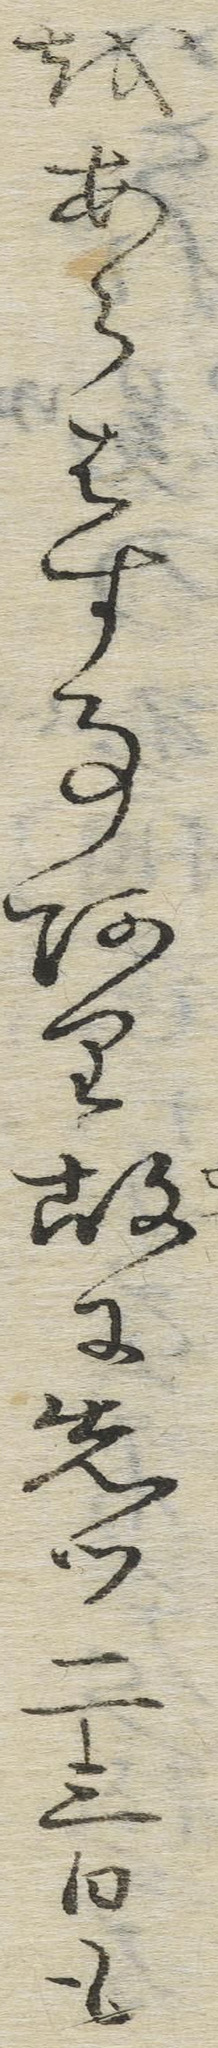をあらはす事あり故に先つ二三日も
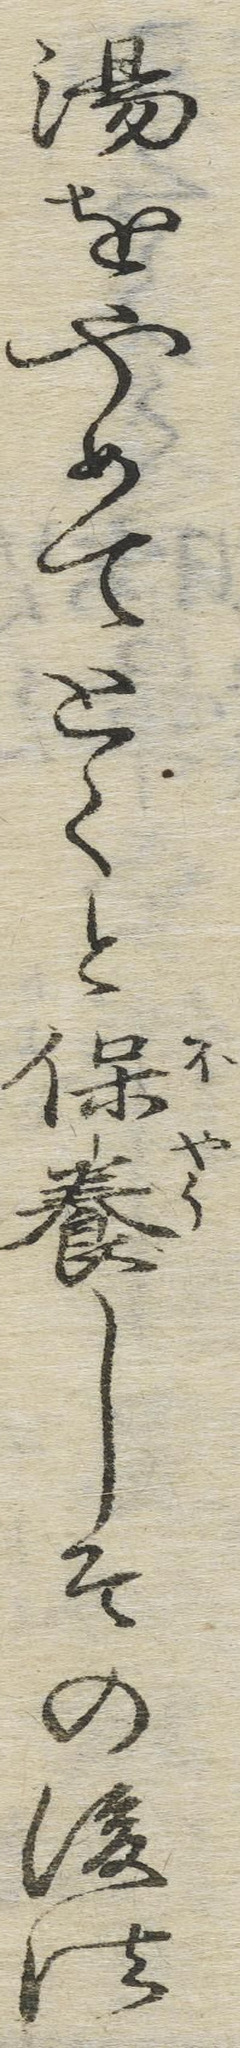湯をやめてとくと保養しその後法
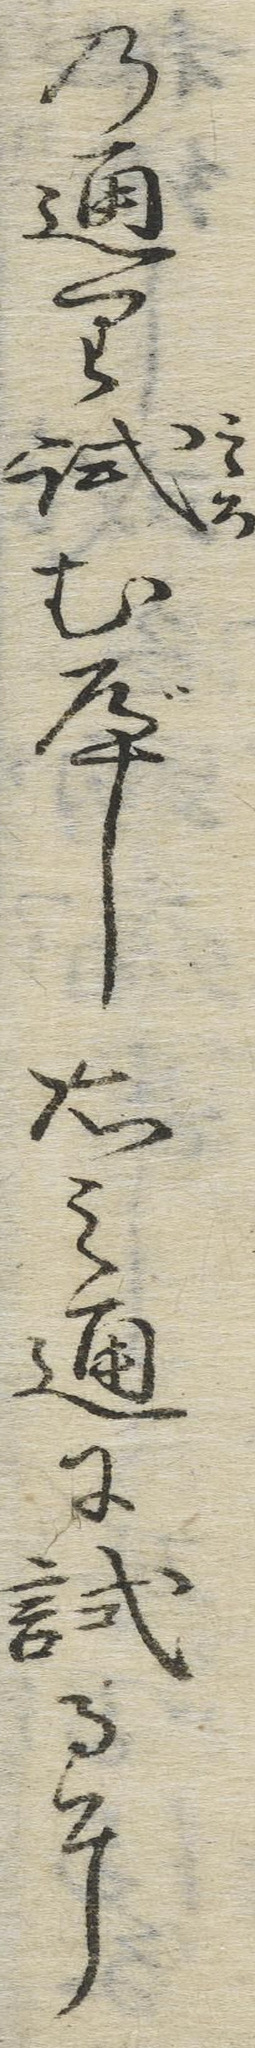の通り試むべし右の通に試るに
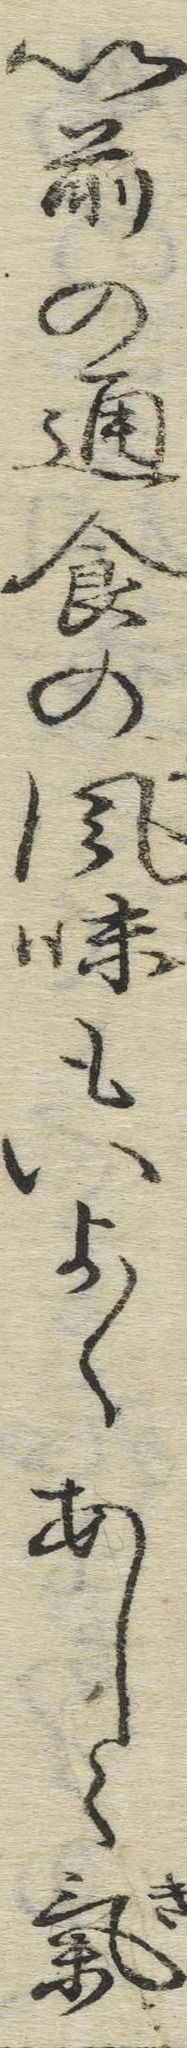以前の通食の風味もいよ〳〵あしく気
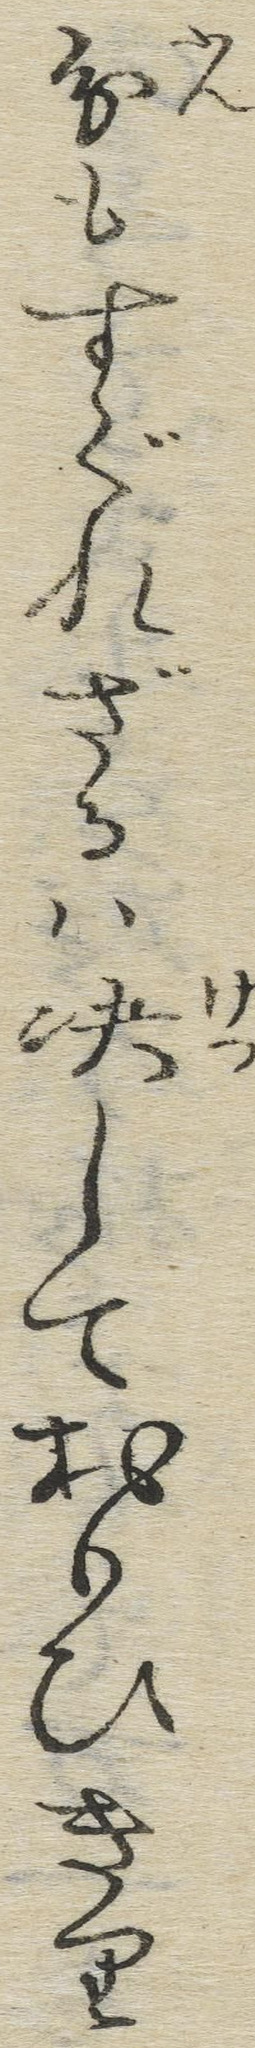分もすぐれざるは決しておもひきり
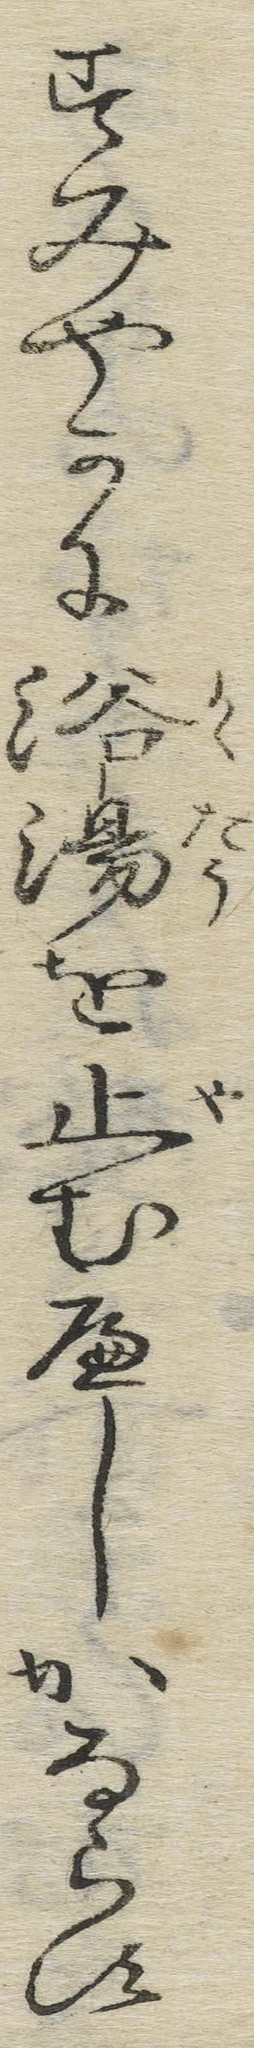すみやかに浴湯を止むへしかならす
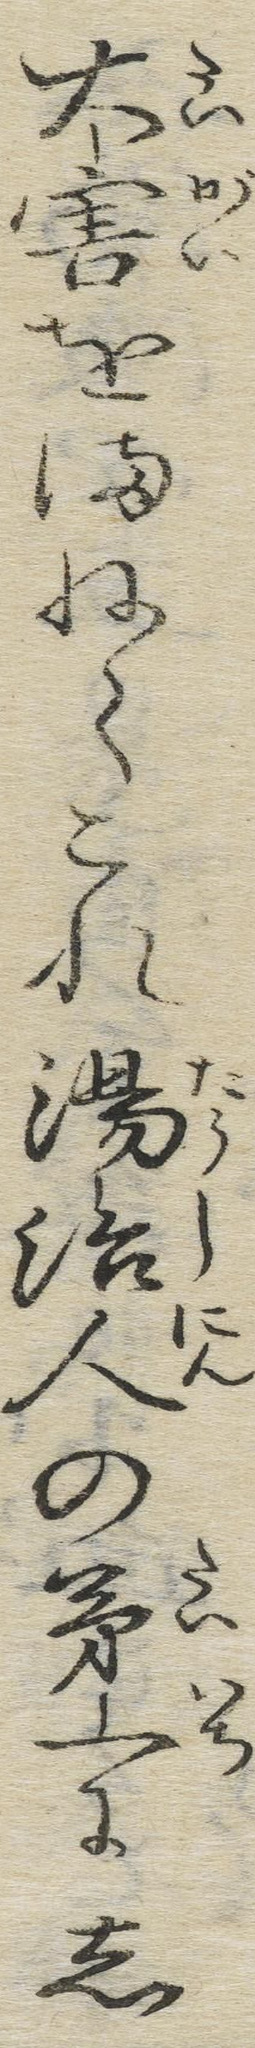大害をまねくこれ湯治人の第一にし
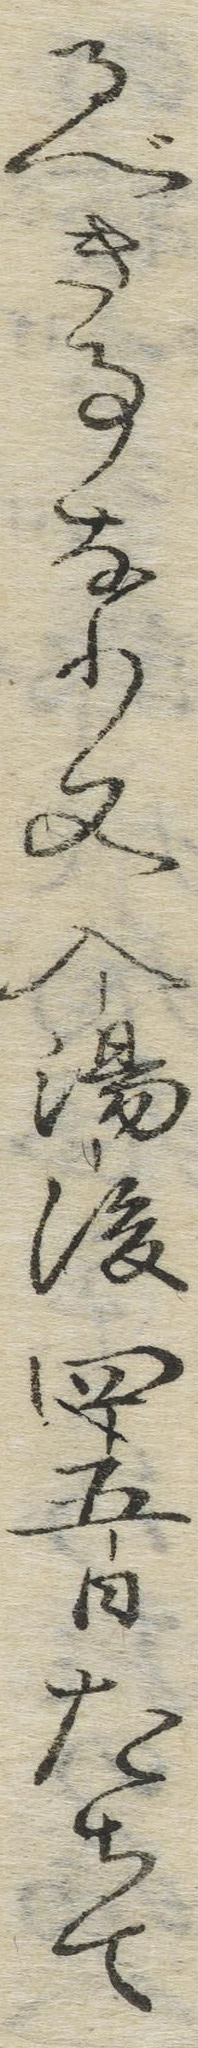るべき事なり又入湯後四五日たちて
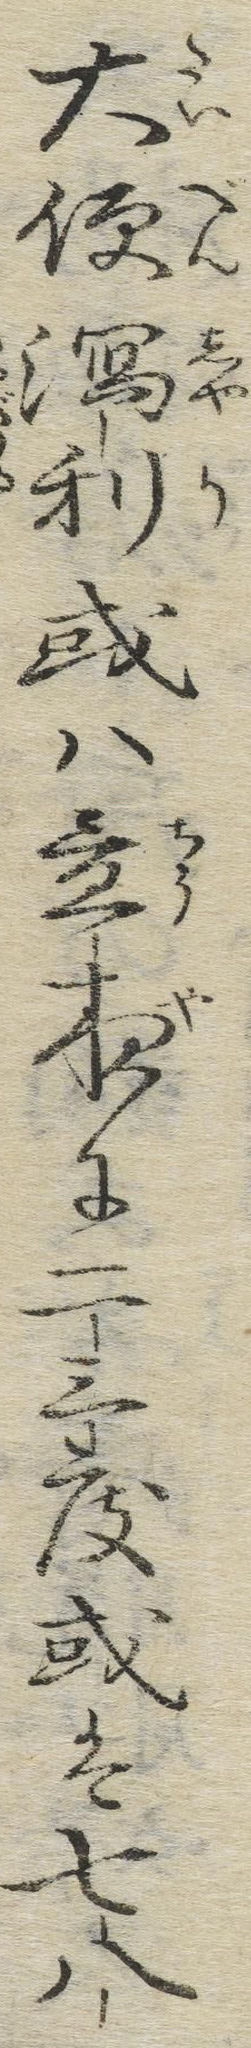大便瀉利或は昼夜に二三度或は七八
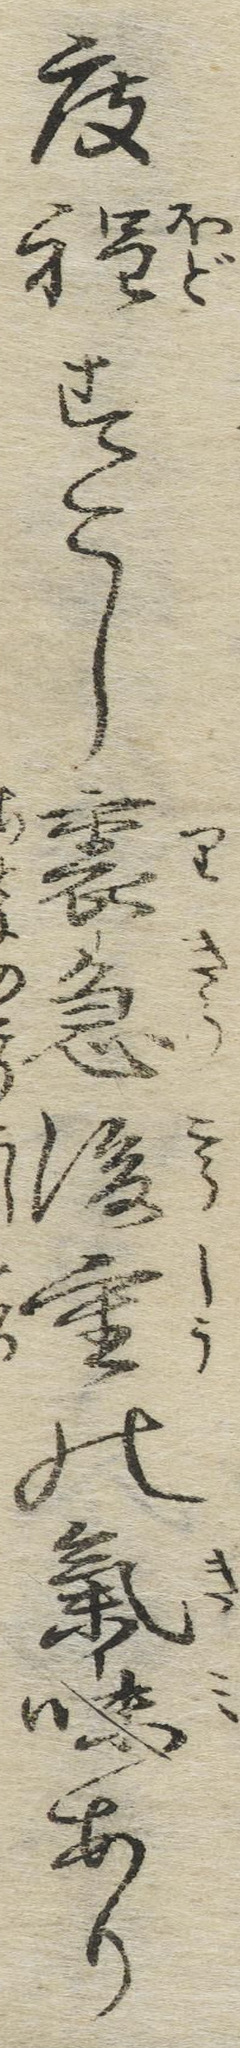度程すこし裏急後重の気味あり
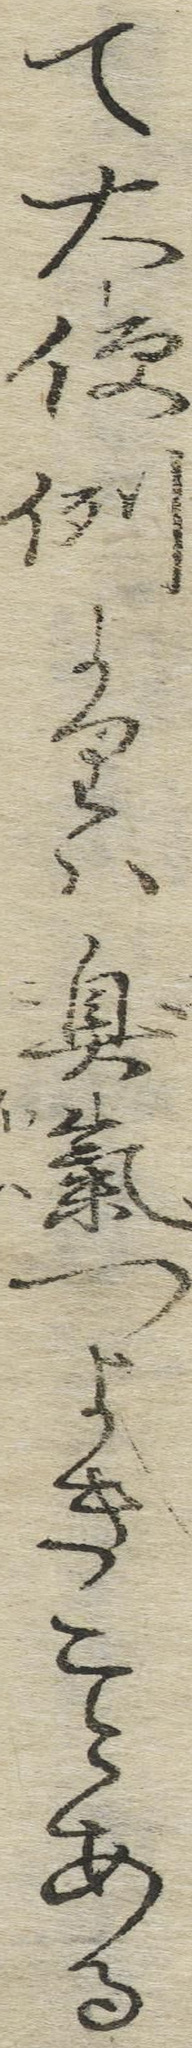て大便例よりは臭気つよきことある

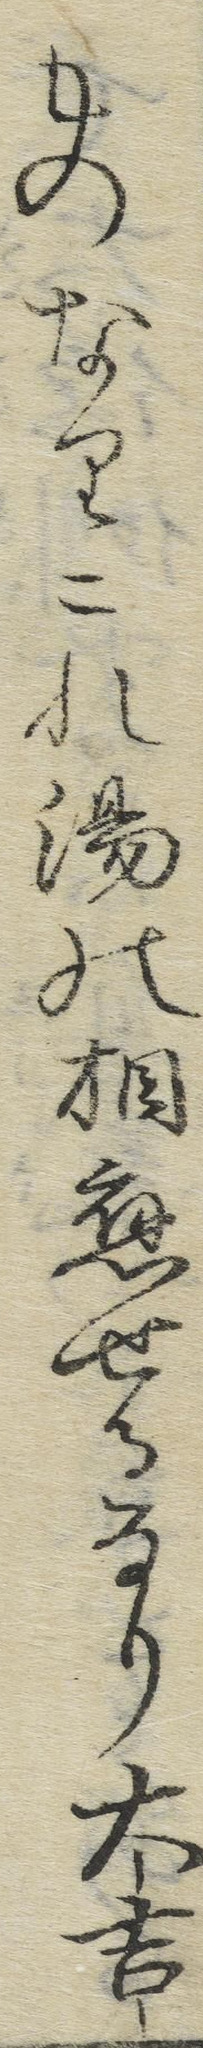ものなりこれ湯の相応せるなり大吉
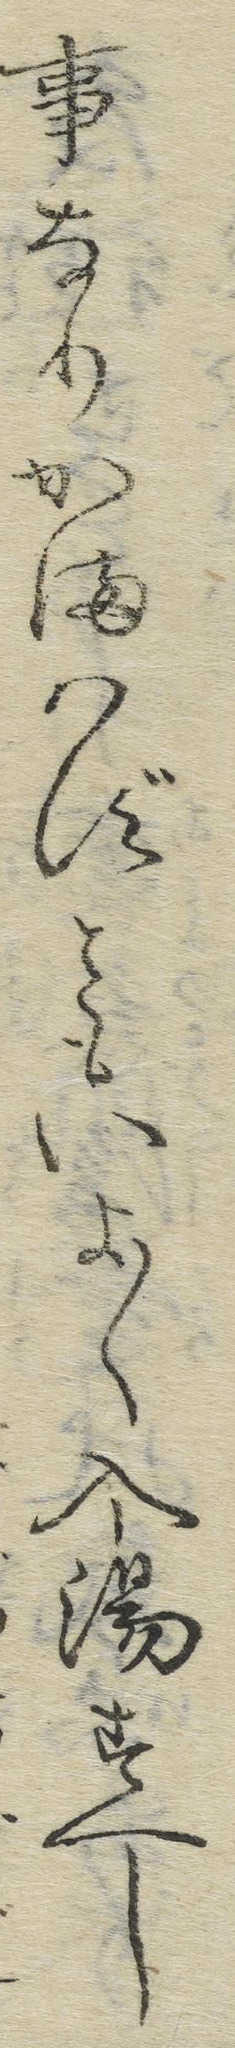事なりかまはずともいよ〳〵入湯すへし
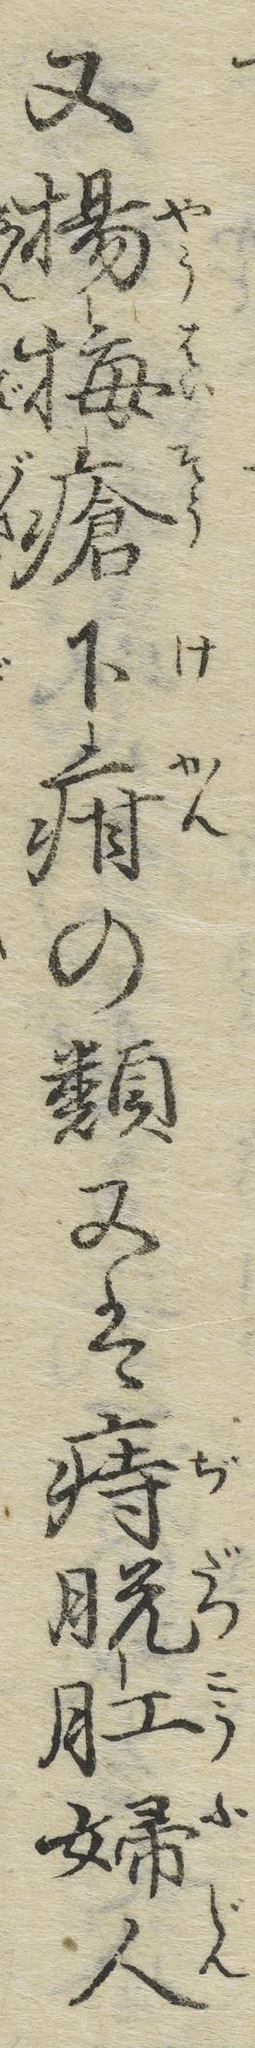又楊梅瘡下疳の類又は痔脱肛婦人
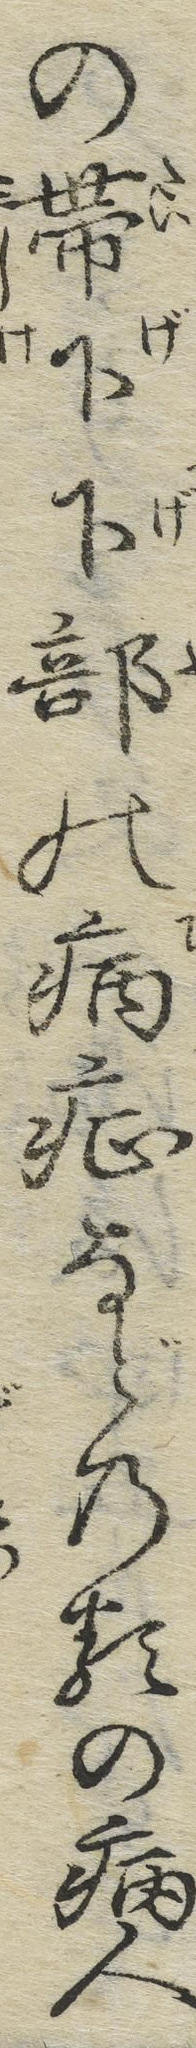の帯下下部の病症などの類の病人
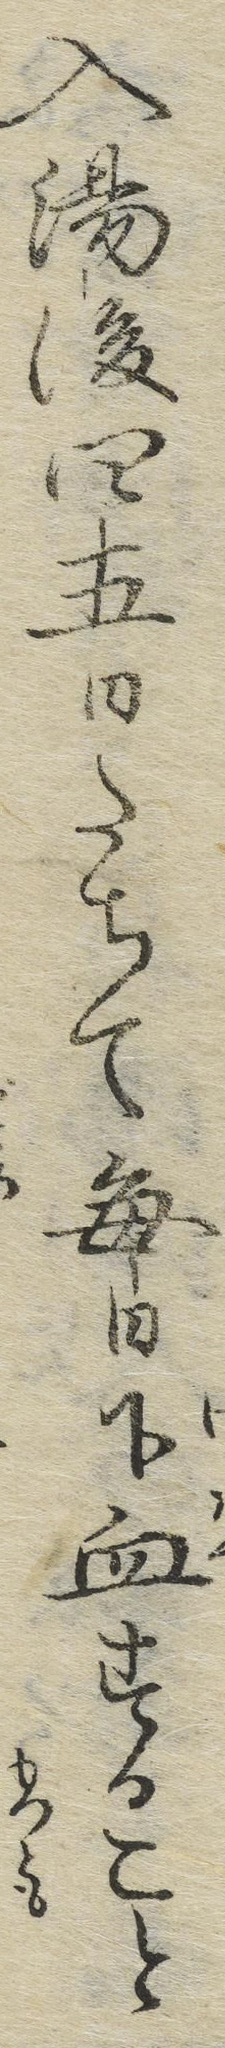入湯後四五日たちて毎日下血すること
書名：温泉考
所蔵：東京大学地震研究所図書室 Earthquake Research Institute Library, The University of Tokyo, JAPAN
